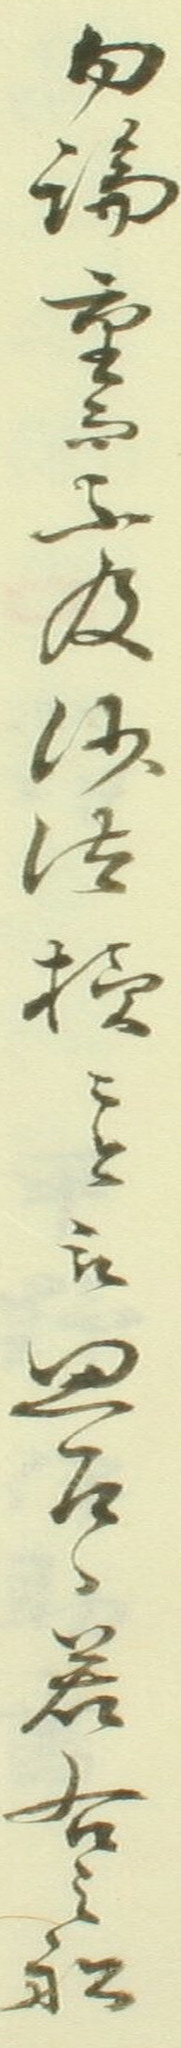勿論重而不及沙汰様にと被思召候若右之船
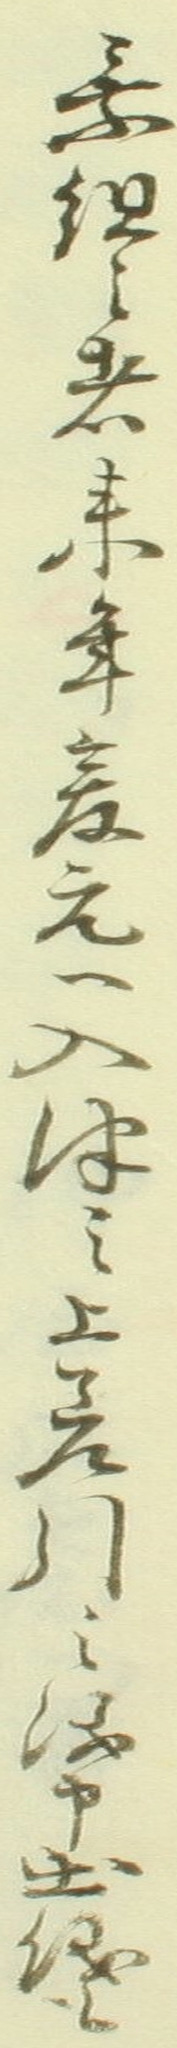乗組之者来年爰元へ入津之上差引之儀申出儀も
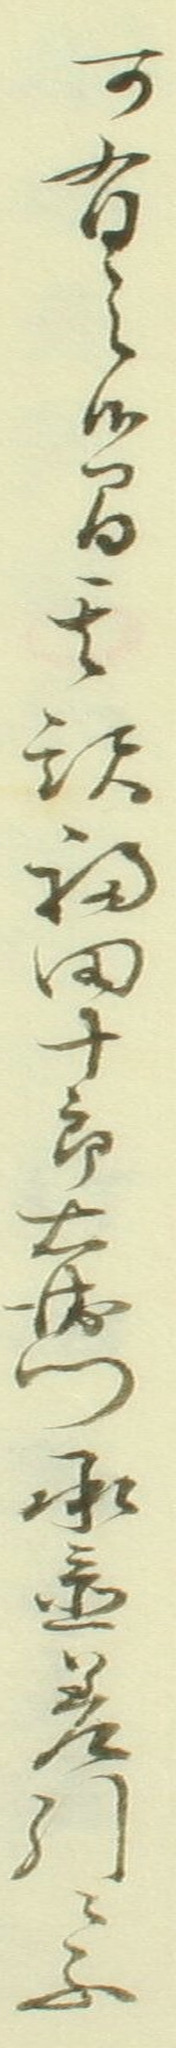可有之候間其訳福田十郎右衛門承置差引に不
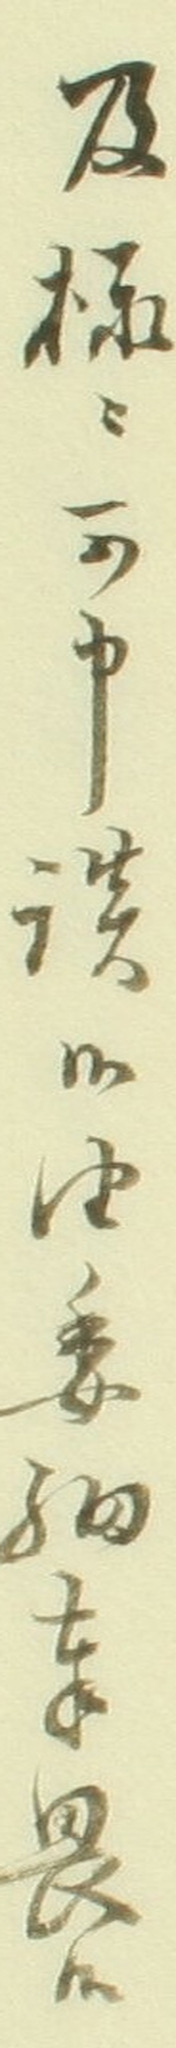及様に可申談候由委細奉畏候
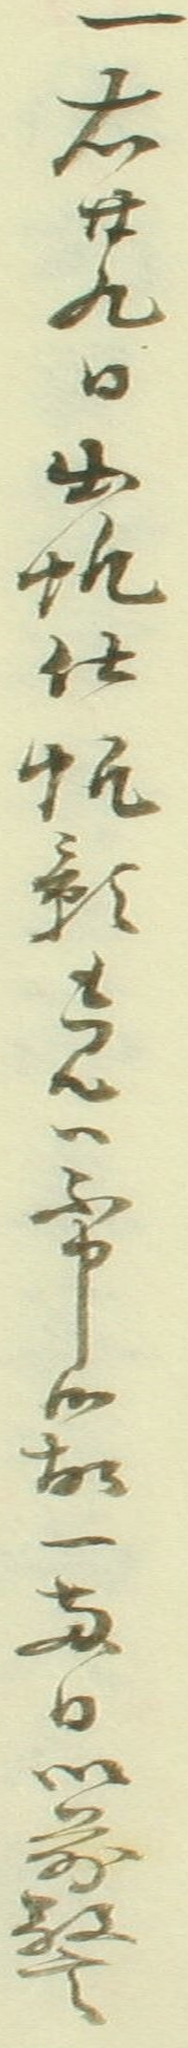一右廿九日出帆仕帆影も見へ不申候故一両日御前警
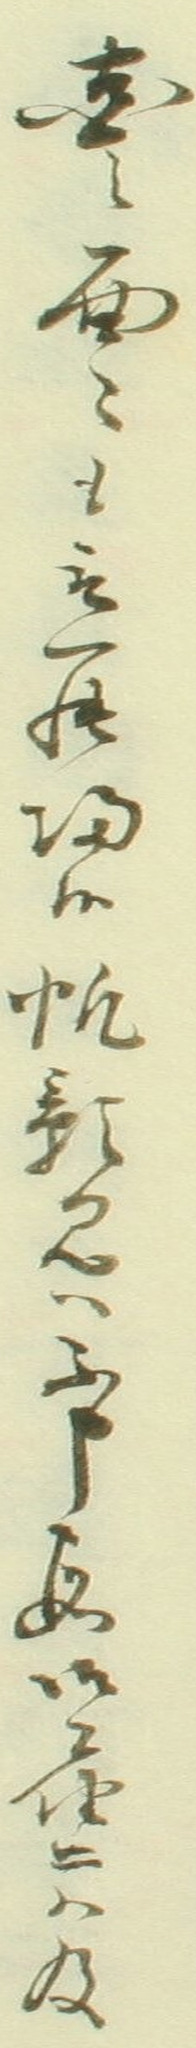固之面々も被罷帰候帆影見へ不申段御届には及
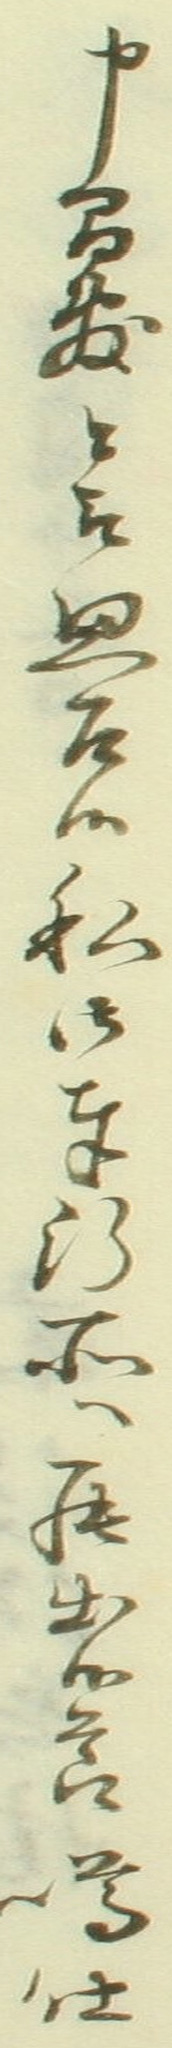申間敷と被思召候私御奉行所へ罷出候節噂仕
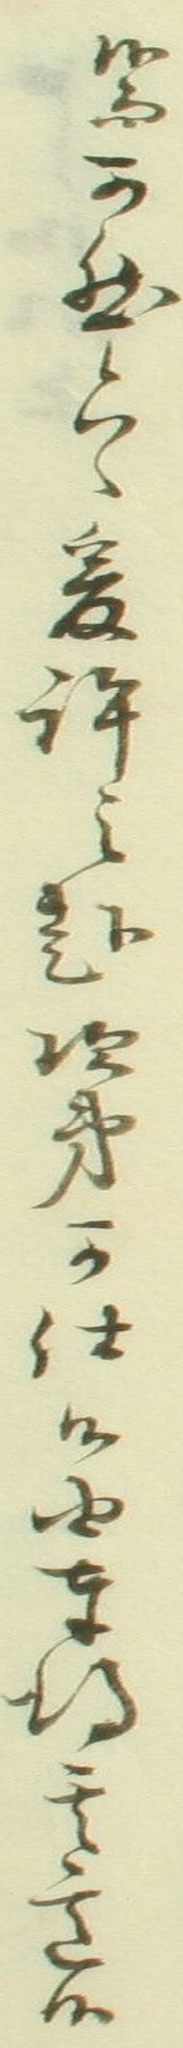候而可然候はゝ爰許之赴次第可仕候由奉得其意候
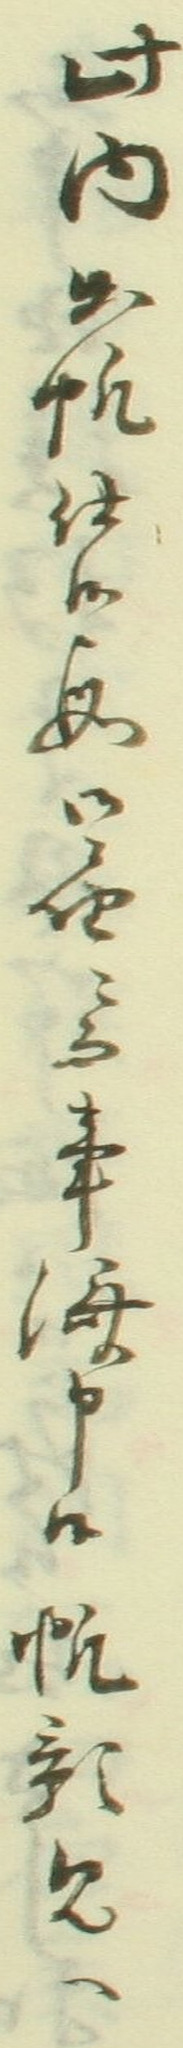此内出帆仕候段御届に而事済申候帆影見へ

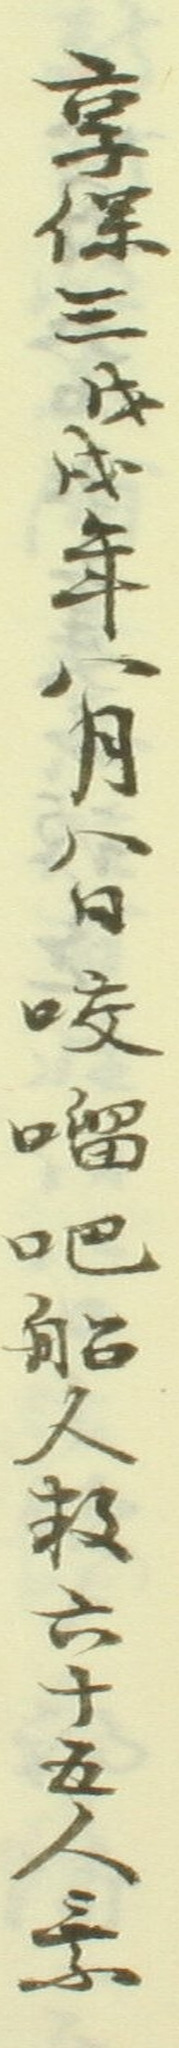享保三戊戌年八月八日咬𠺕吧船船人数六十五人乗
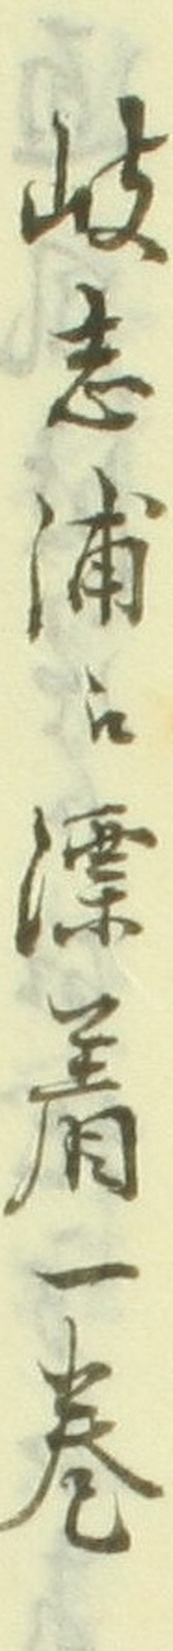岐志浦え漂着一巻
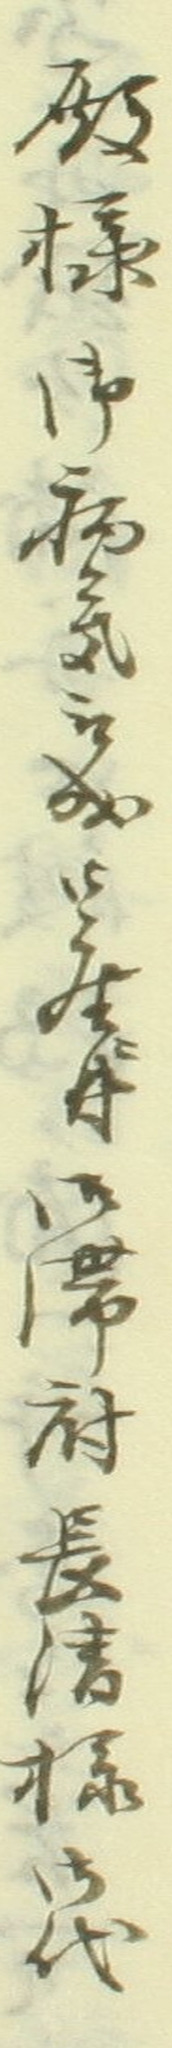殿様御病気被成御座候に付御滞府長清様御代
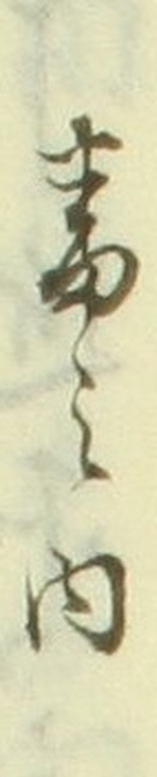番之内
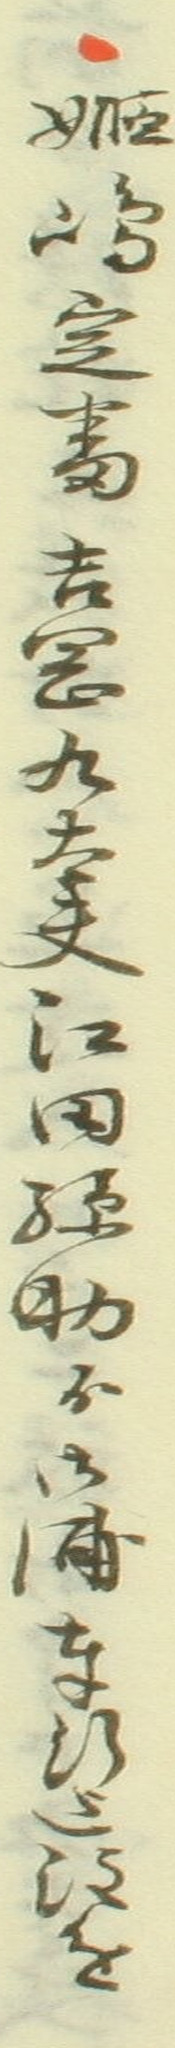姫島定番吉岡九太夫江田孫助ゟ御浦奉行迄注進
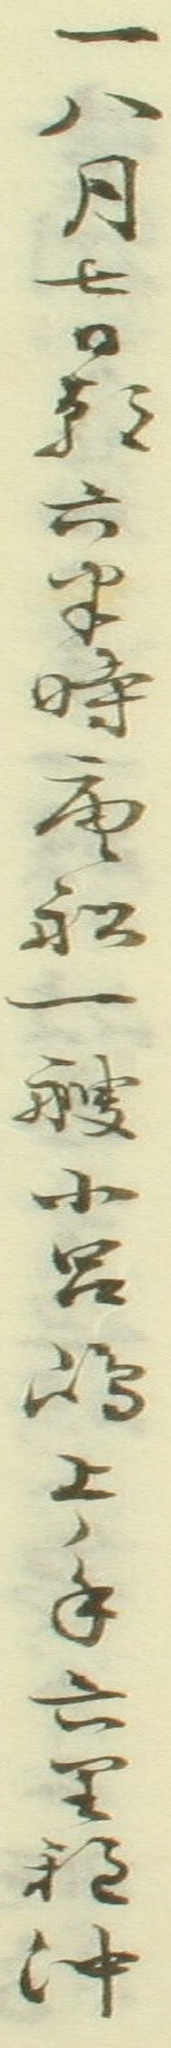一八月七日朝六半時唐船一艘小呂島上ノ手六里程沖
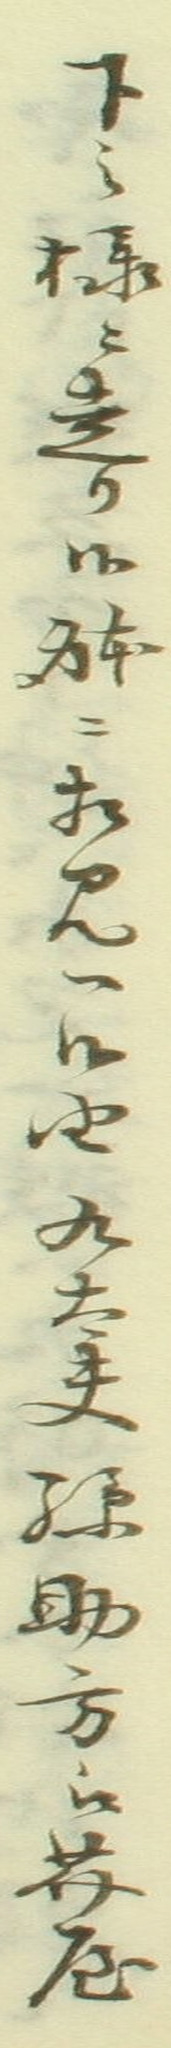下之様に走り候躰に相見へ候由九太夫孫助方え芥屋
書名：異国船漂着記
